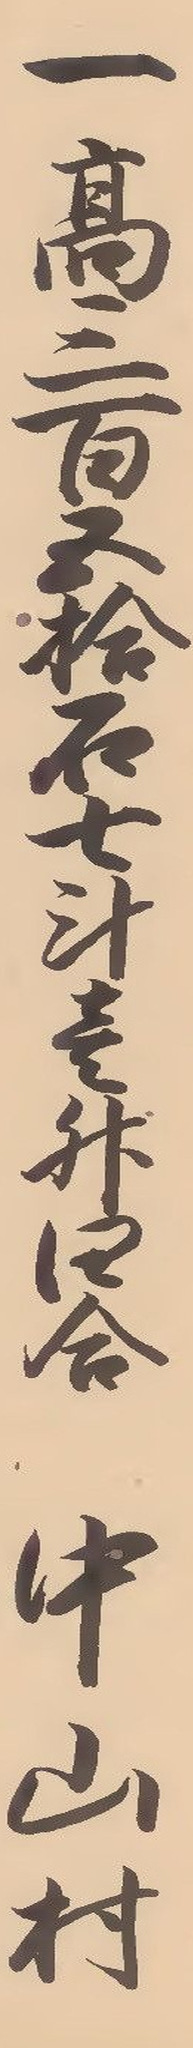一高三百五拾石七斗壱升四合中山村
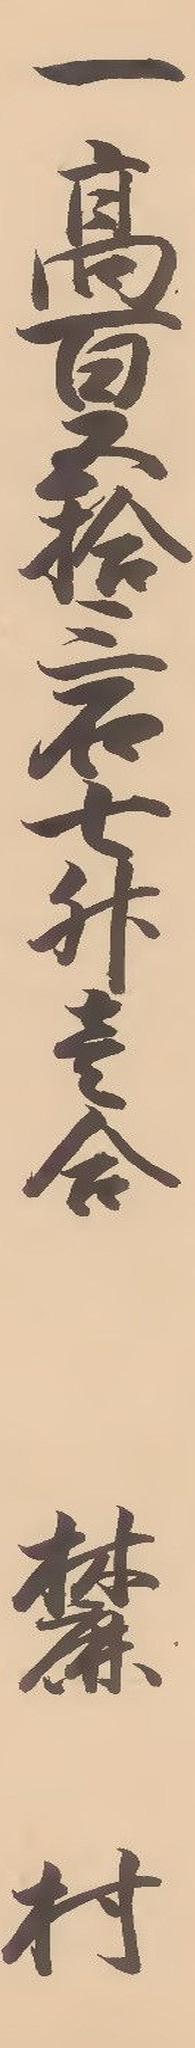一高百五拾三石七升壱合麓村
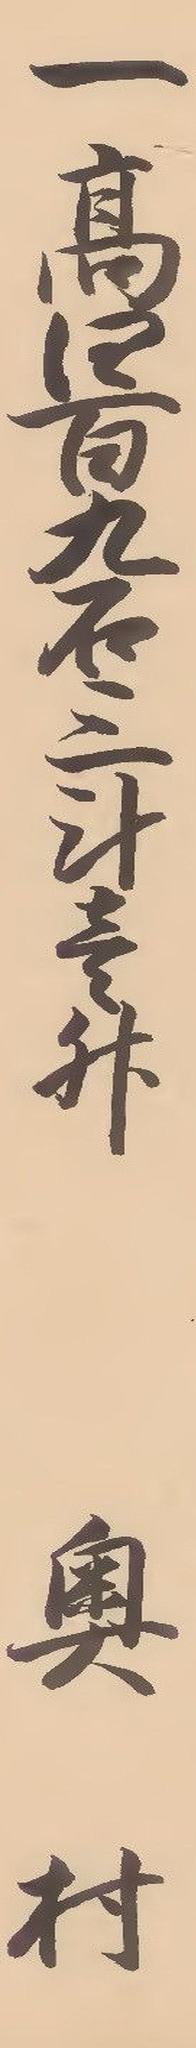一高四百九石三斗壱升奥村
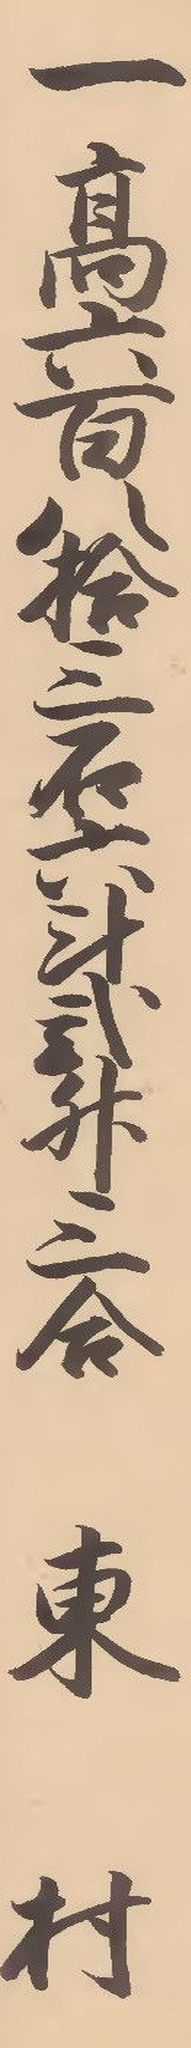一高六百八拾三石六斗弐升三合東村
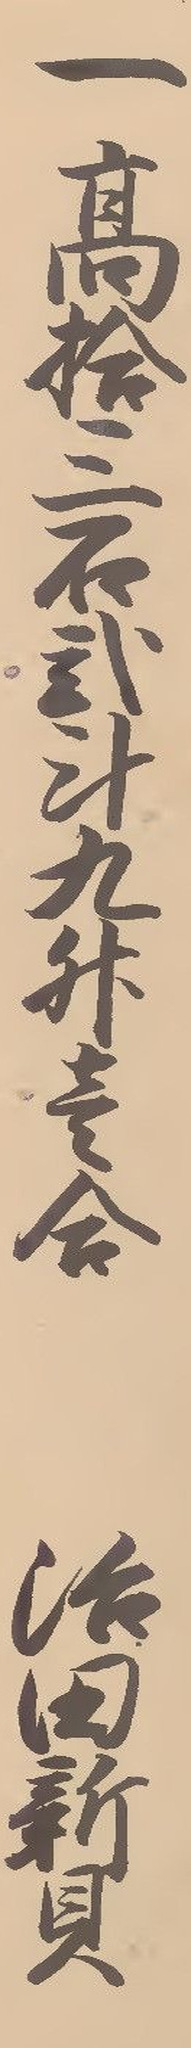一高拾三石弐斗九升壱合治田新貝
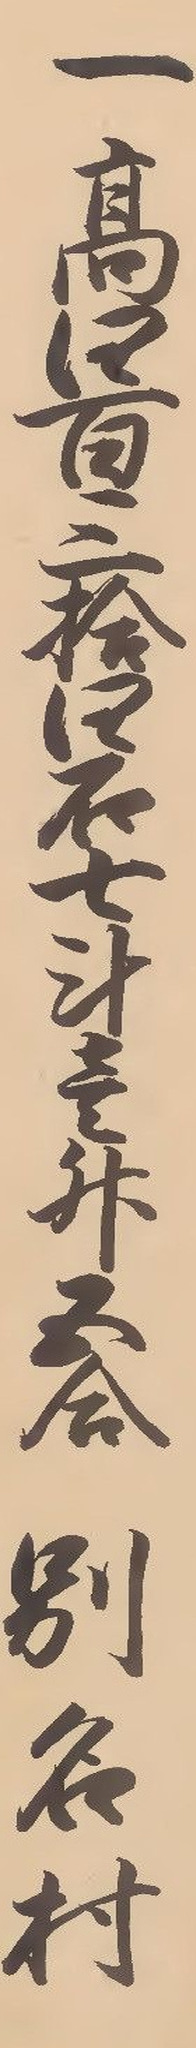一高四百三拾四石七斗壱升五合別名村
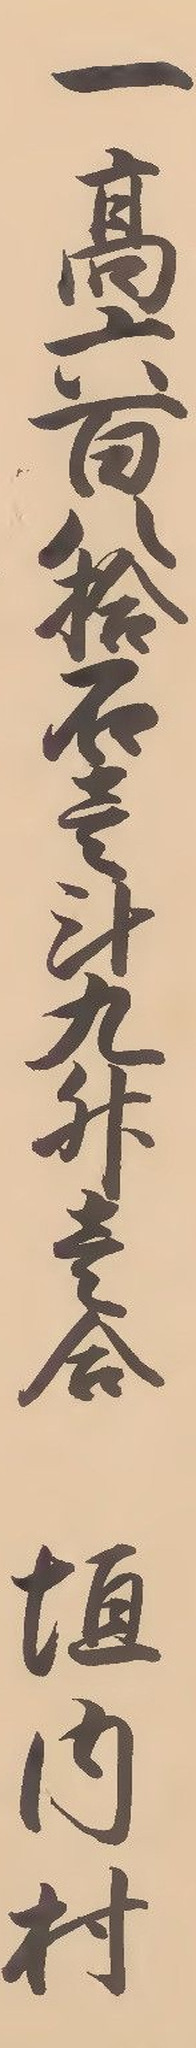一高六百八拾石壱斗九升壱合垣内村
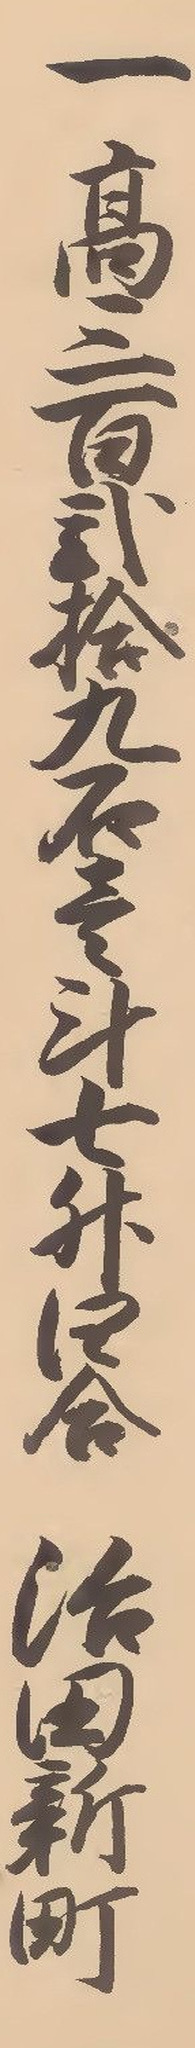一高三百弐拾九石壱斗七升四合治田新町

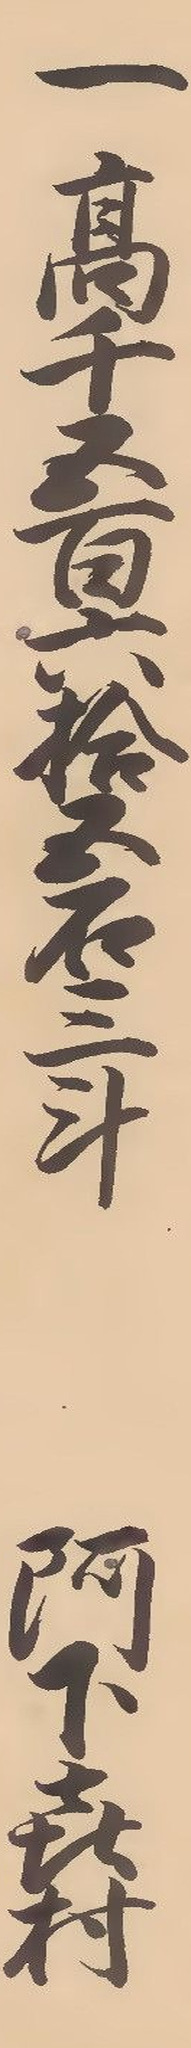一高千五百六拾五石三斗阿下喜村
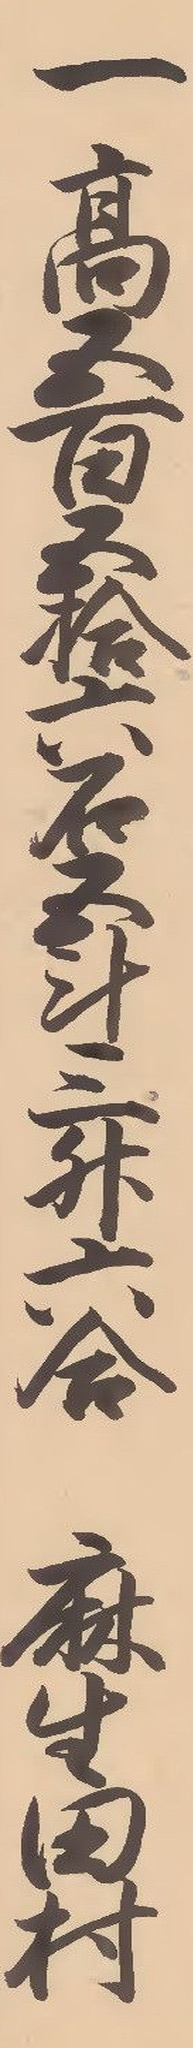一高五百五拾六石五斗三升六合麻生田村
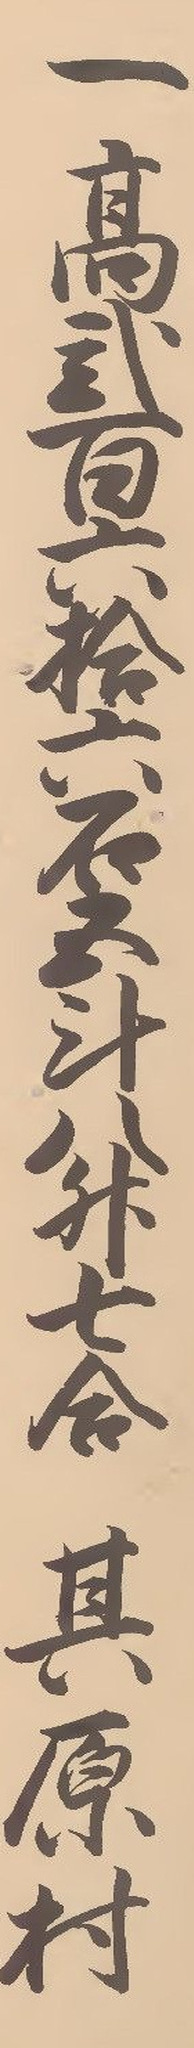一高弐白六拾六石五斗八升七合其原村
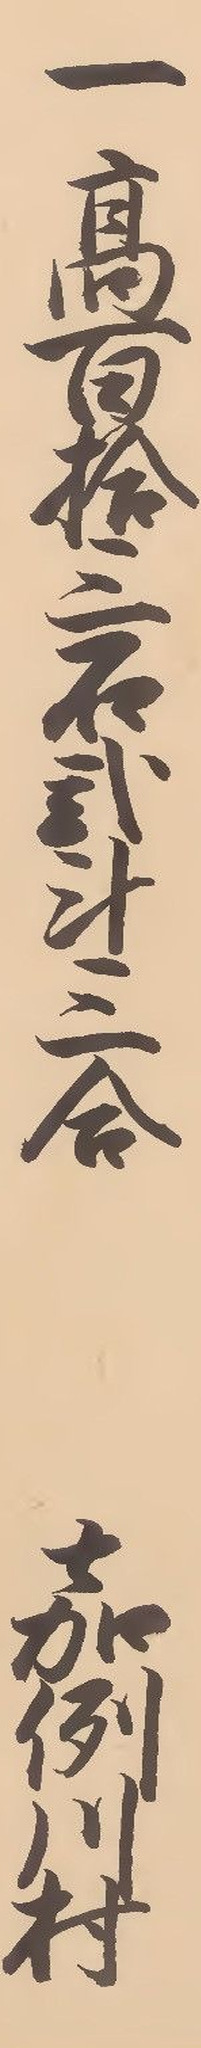一高百拾三石弐斗三合嘉例川村
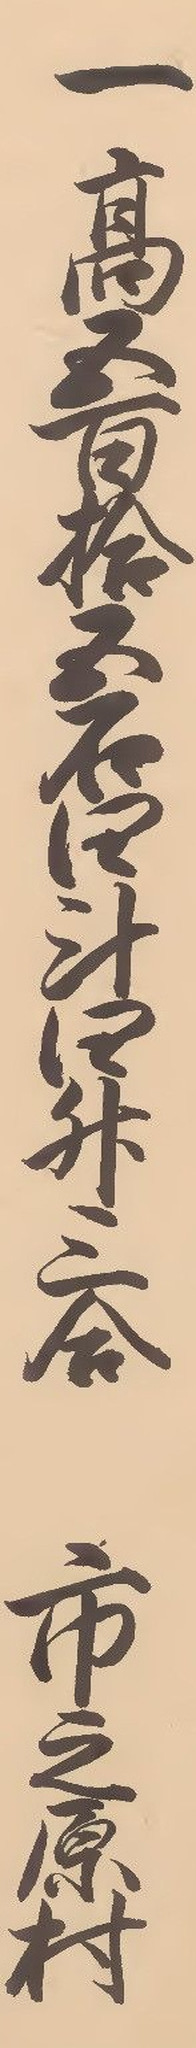一高五百拾五石四斗四升三合市之原村
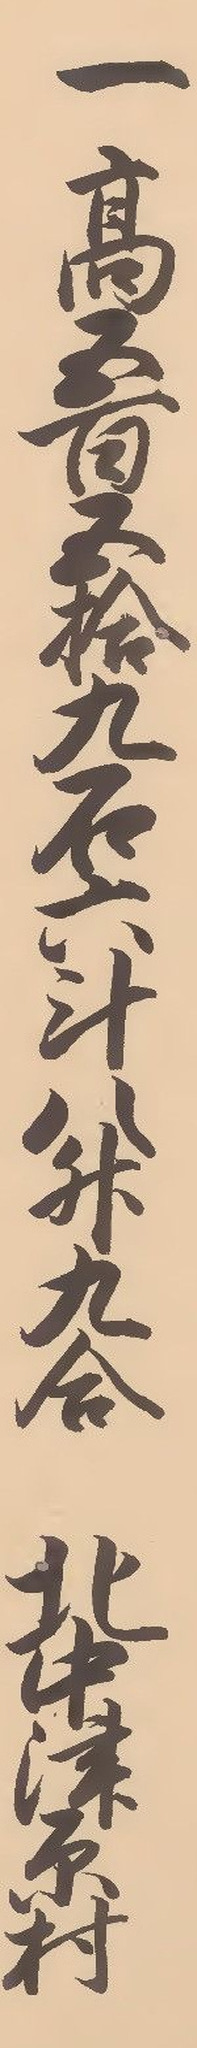一高五百五拾九石六斗八升九合北中津原村

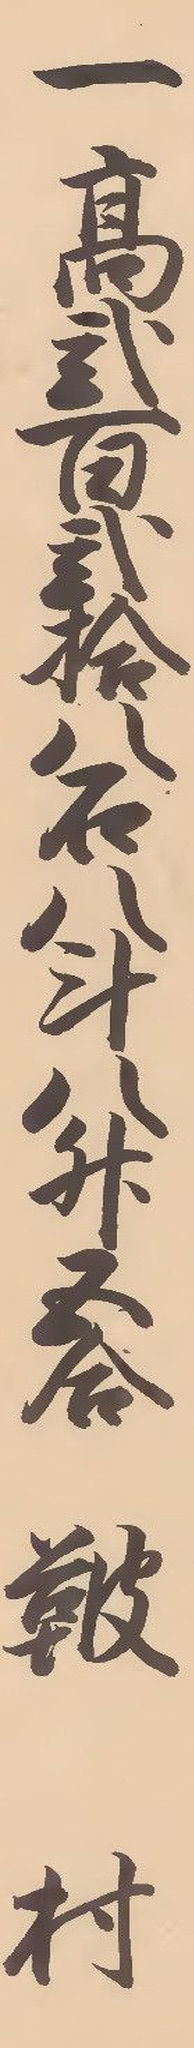一高弐百弐拾八石八斗八升五合皷村
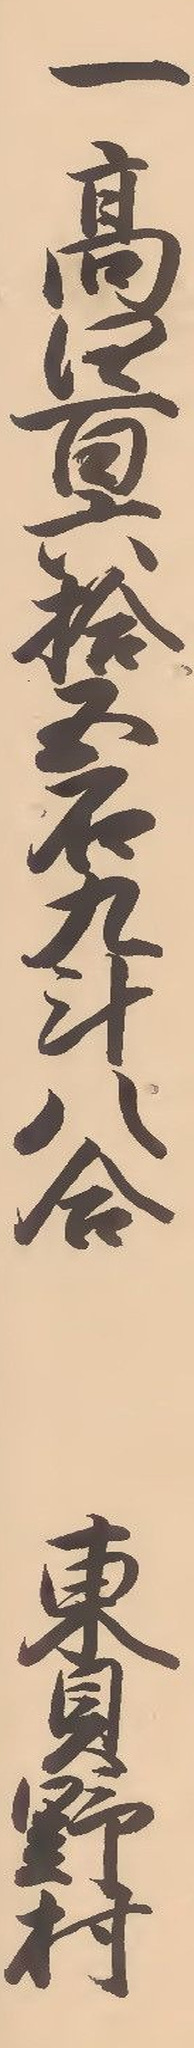一高四百六拾五石九斗八合東貝野村
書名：伊勢国郷帳
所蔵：国立公文書館 National Archives of Japan
